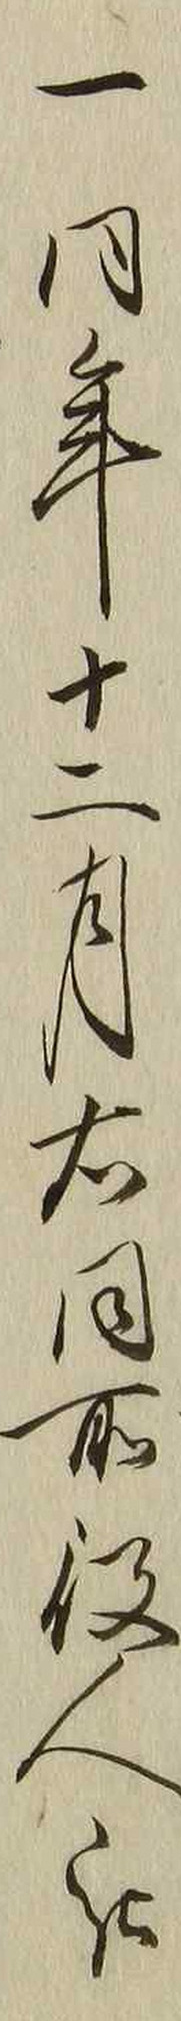一同年十二月右同所役人被
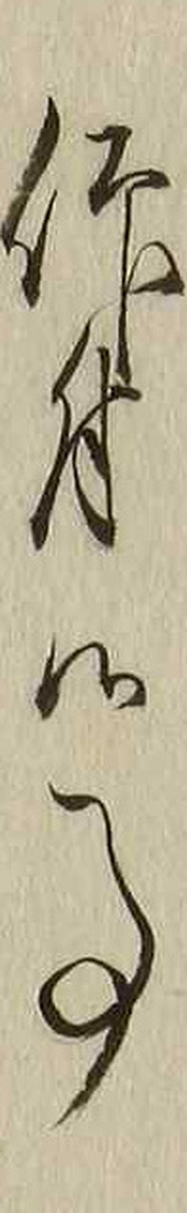仰付候事
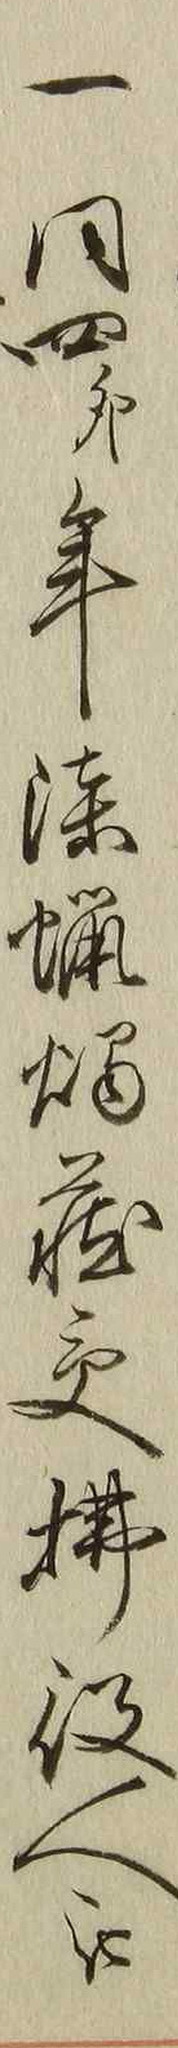一同四卯年漆蝋燭蔵受払役人被
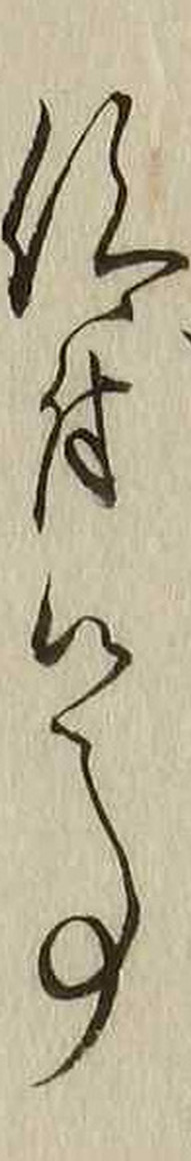仰付候事
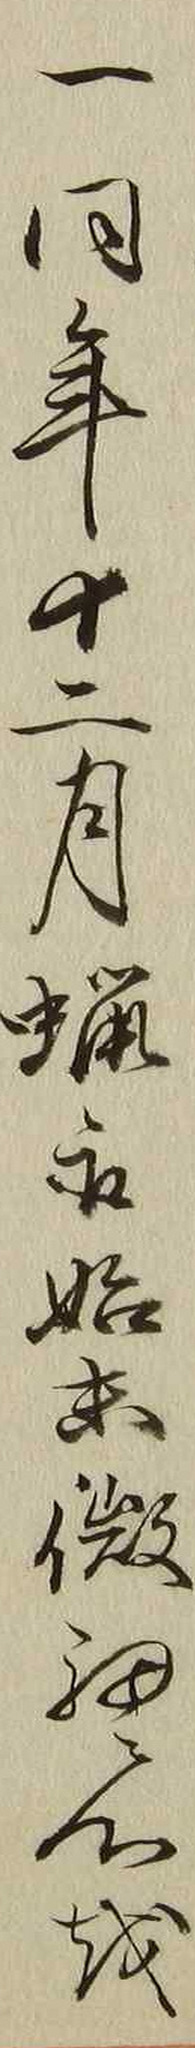一同年十二月蝋取始末微細ニ心を
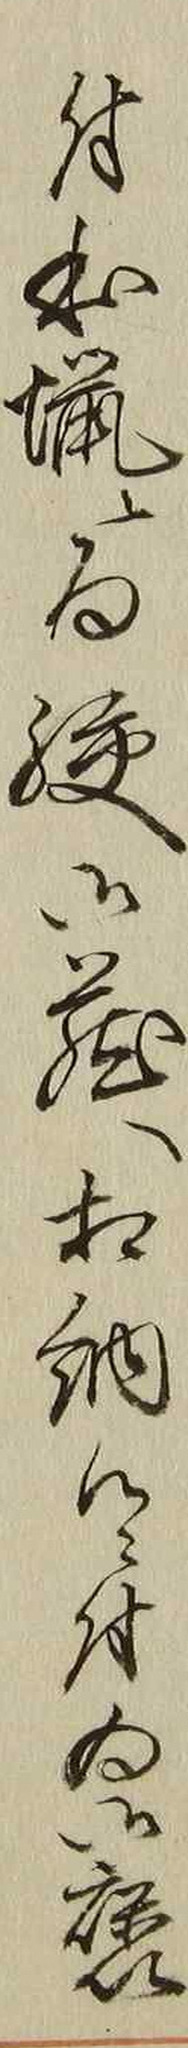付本蝋に為絞御蔵へ相納候ニ付為御褒
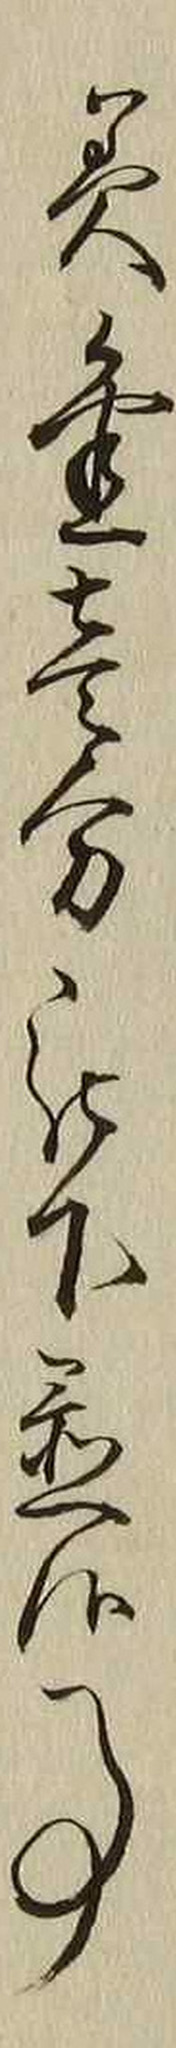美金壱分被下置候事
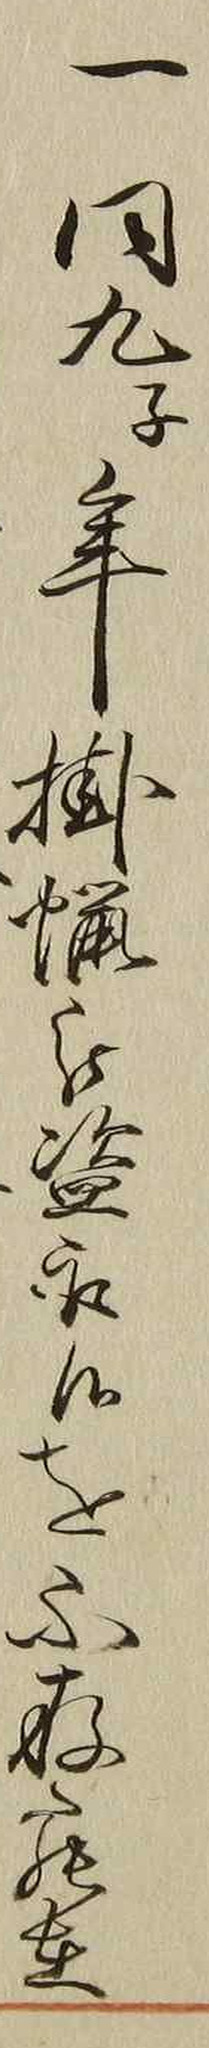一同九子年掛蝋被盗取候を不存罷在
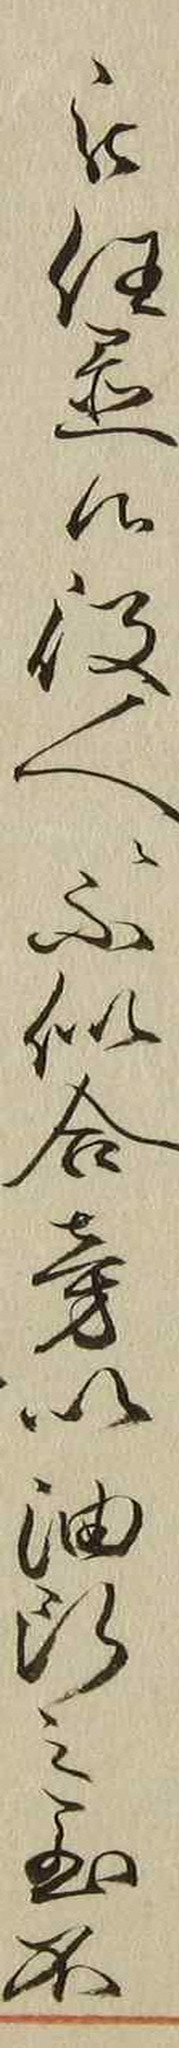被任置候役人ニ不似合旁以油断之至不
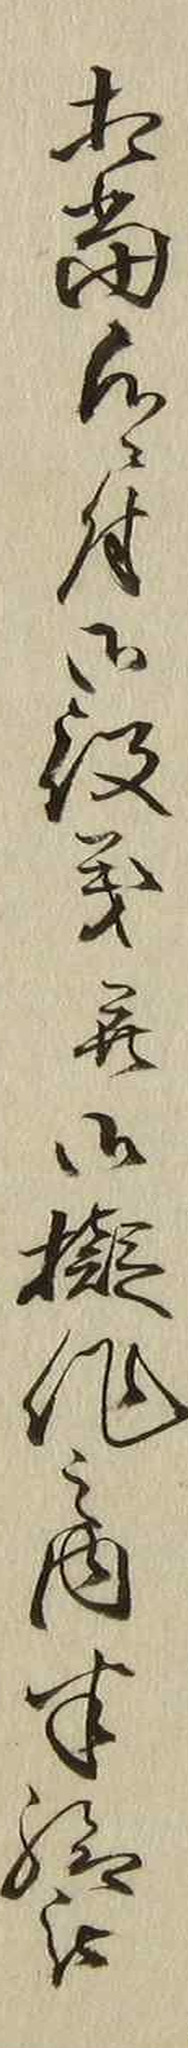相当候ニ付御役義并御擬作之内半給被
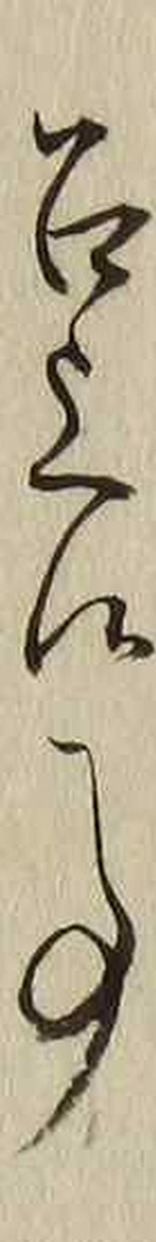召上候事
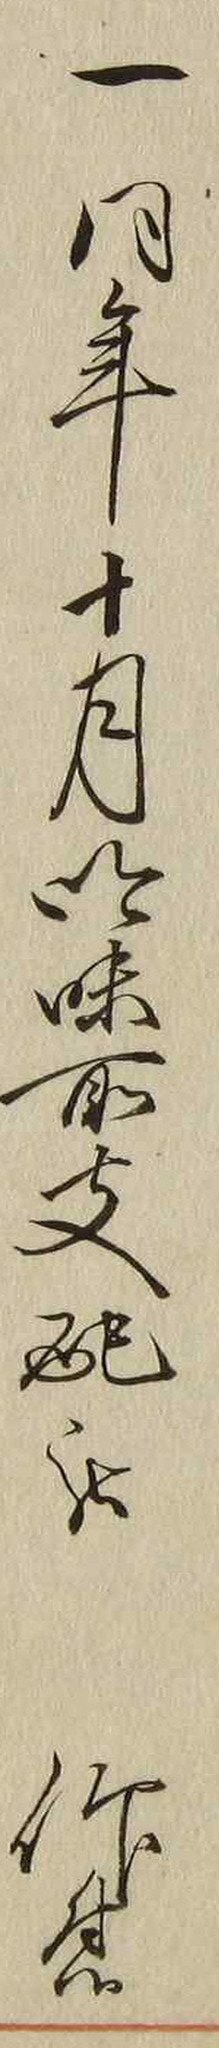一同年十月吟味所支配被仰付候
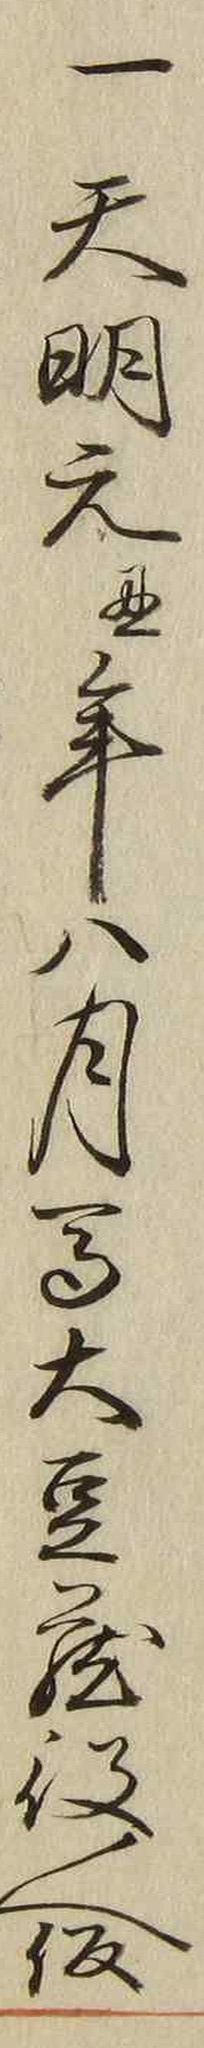一天明元丑年八月馬大豆蔵役人仮
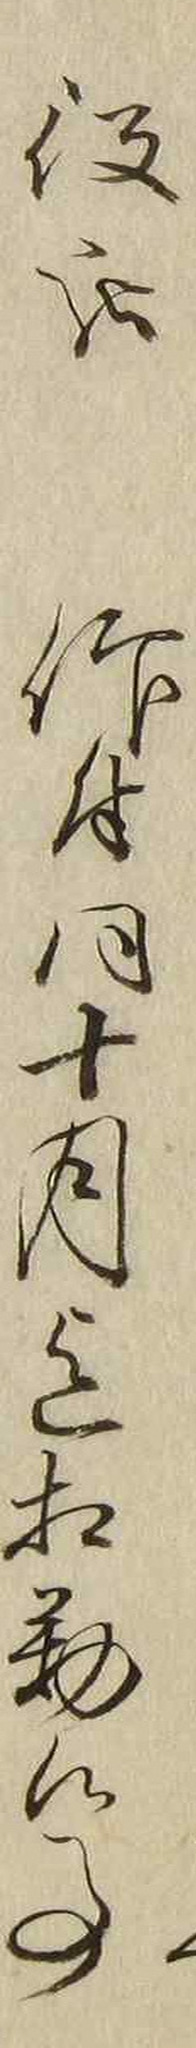役被仰付同十月迄相勤候事
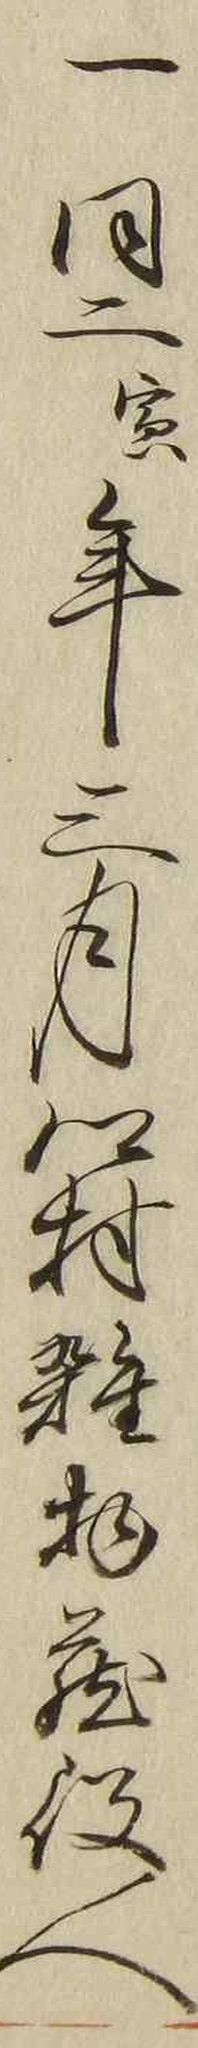一同二寅年三月郷村雑物蔵役人

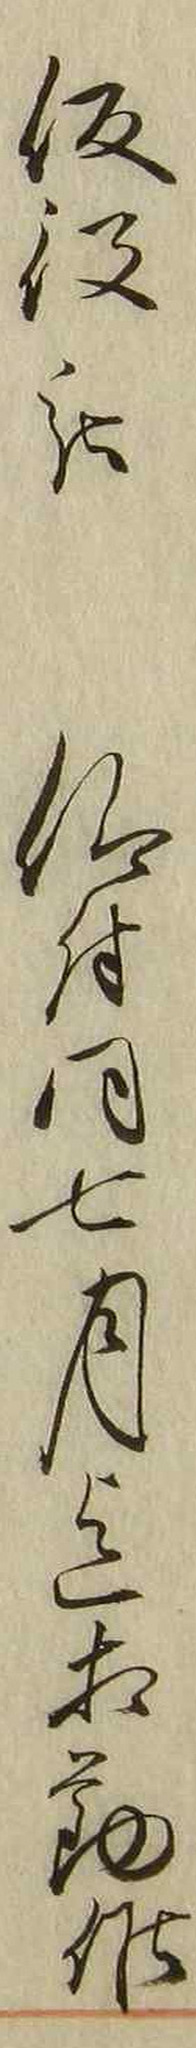仮役被仰付同七月迄相勤候
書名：諸士系譜　巻之57　ほ之部4
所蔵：会津若松市立会津図書館
